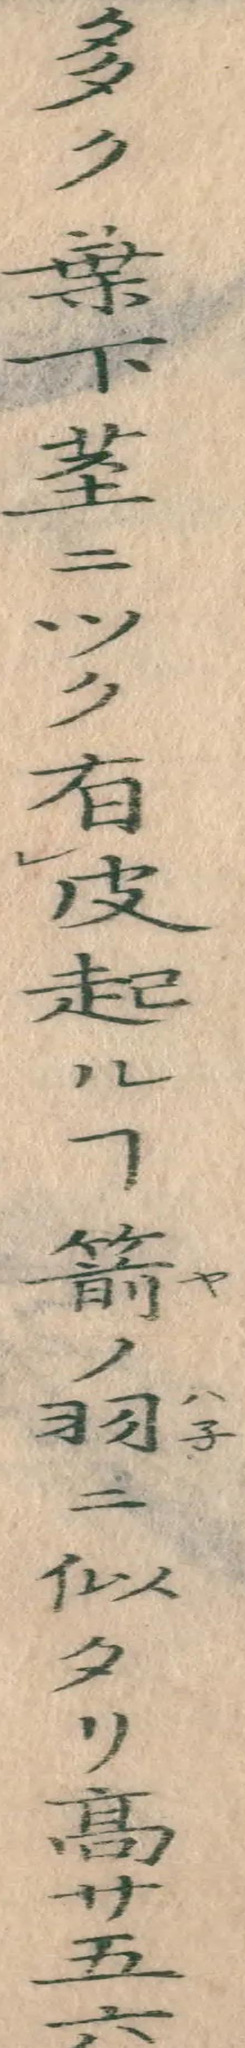多ク葉下茎ニツク有皮起ルコト箭ノ羽ニ似タリ高サ五六

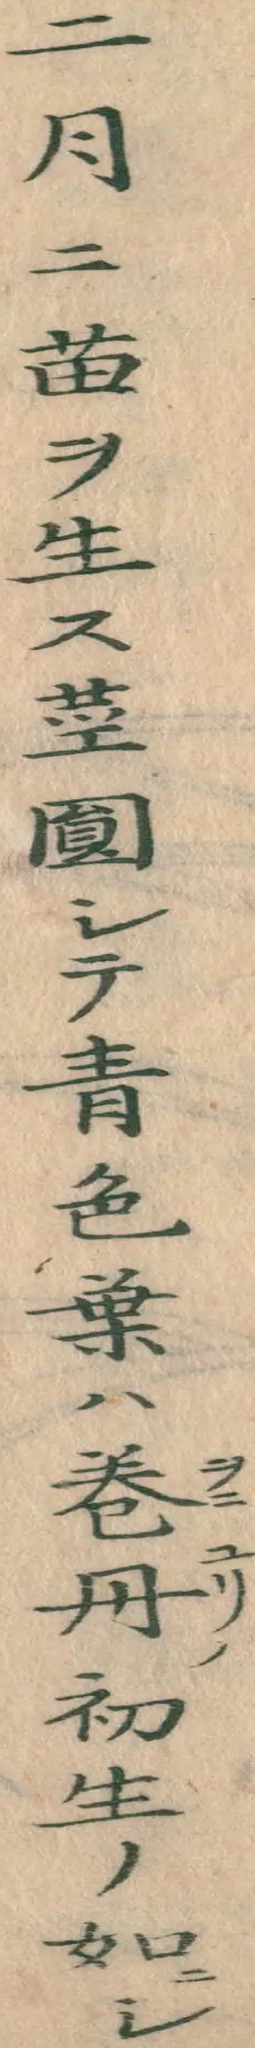二月ニ苗ヲ生ス茎円シテ青色葉ハ巻丹初生ノ如シ
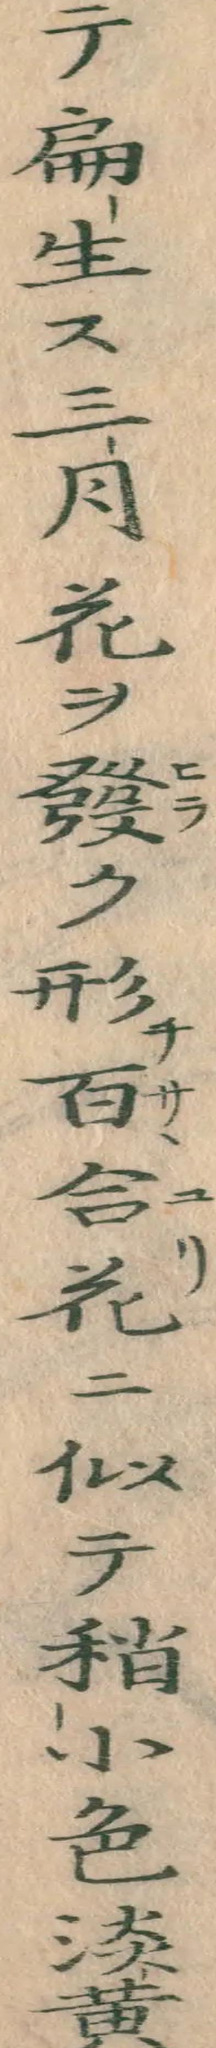テ扁-生ス三-月花ヲ発ク形百合花ニ似テ稍-小色淡-黄
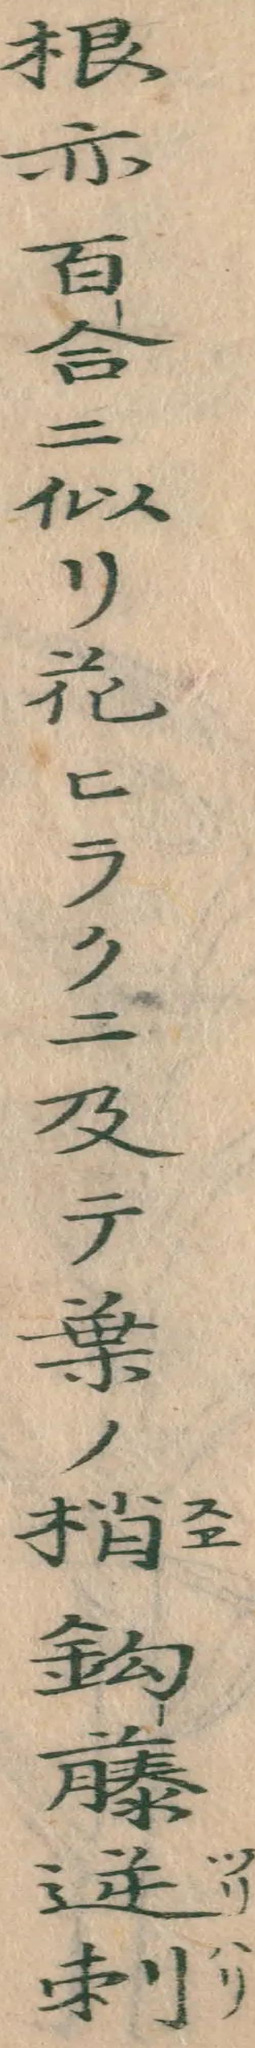根亦百-合ニ似リ花ヒラクニ及テ葉ノ梢鉤-藤逆刺
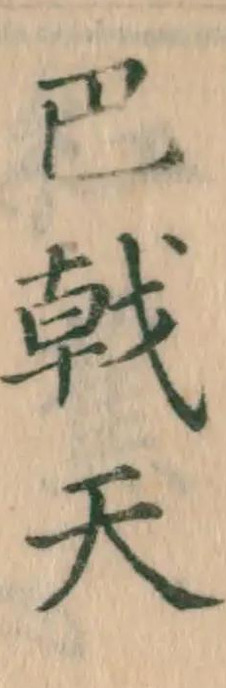巴戟天

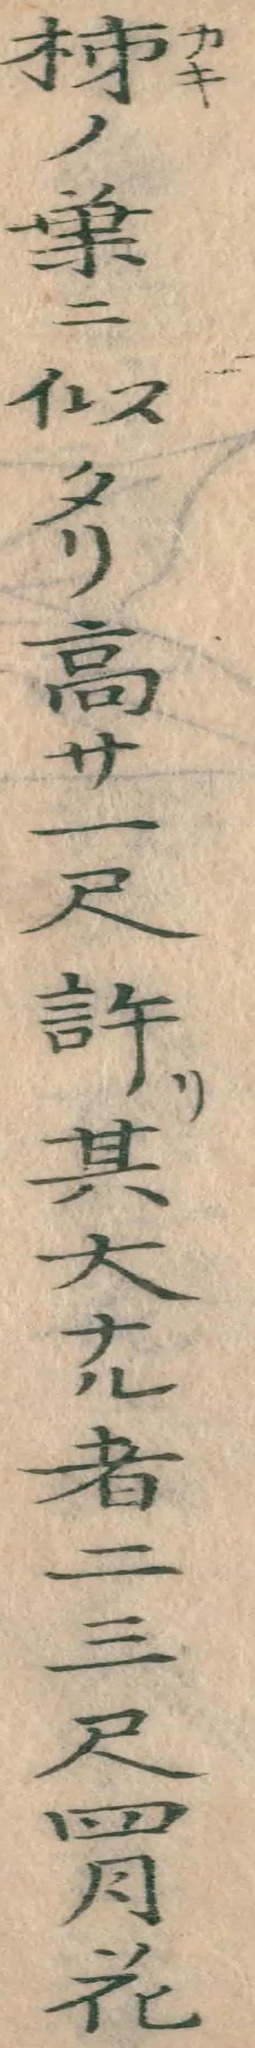柿ノ葉ニ似タリ高サ一尺許其大ナル者二三尺四月花

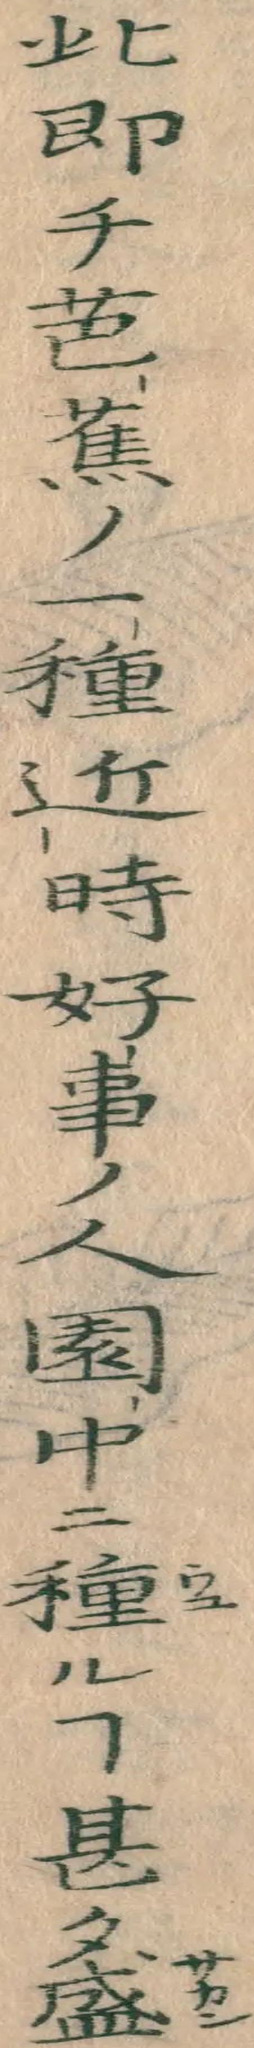此即チ芭-蕉ノ一-種近-時好-事ノ人園-中ニ種ルコト甚タ盛
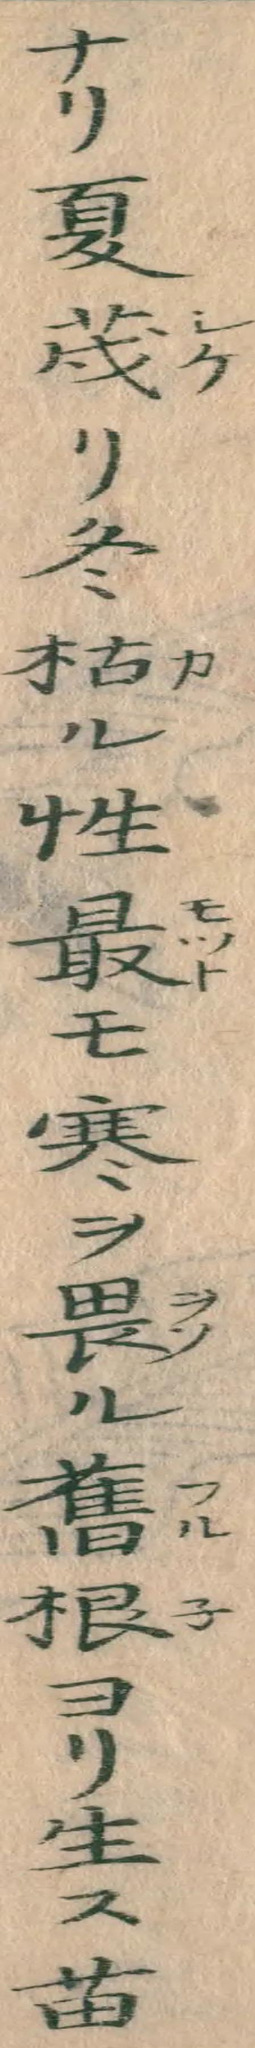ナリ夏茂リ冬枯ル性最モ寒ヲ畏ル旧根ヨリ生ス苗
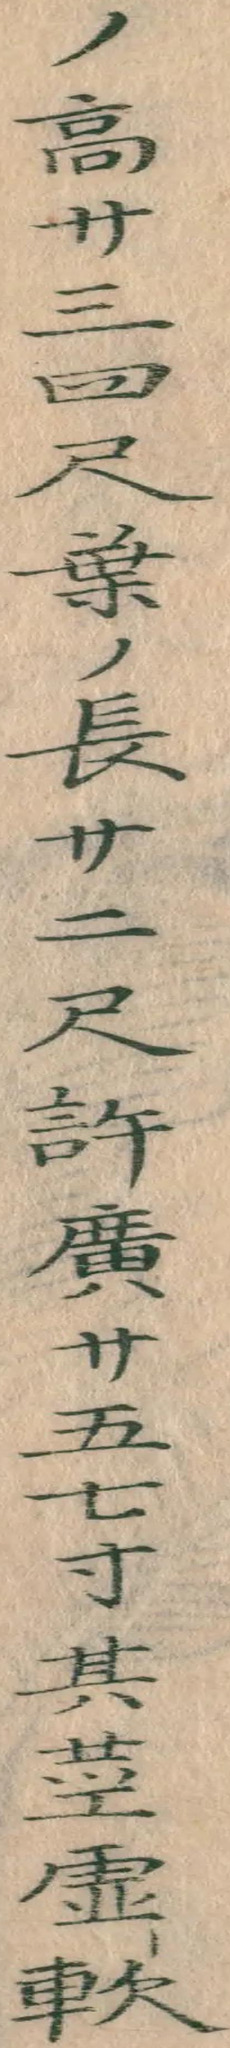ノ高サ三四尺葉ノ長サ二尺許広サ五七寸其茎霊-軟
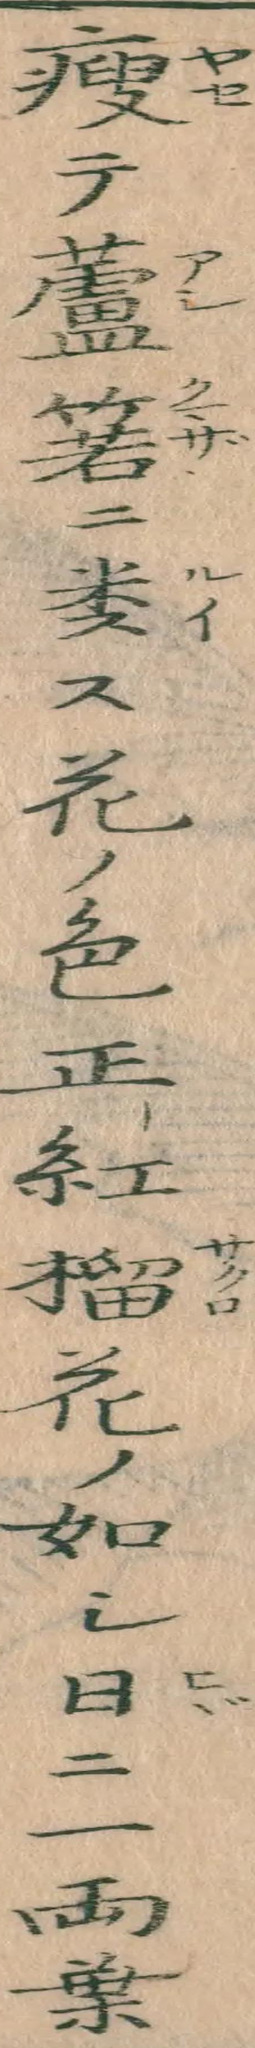痩テ芦箬ニ類ス花ノ色正-紅榴花ノ如シ日ニ一両葉
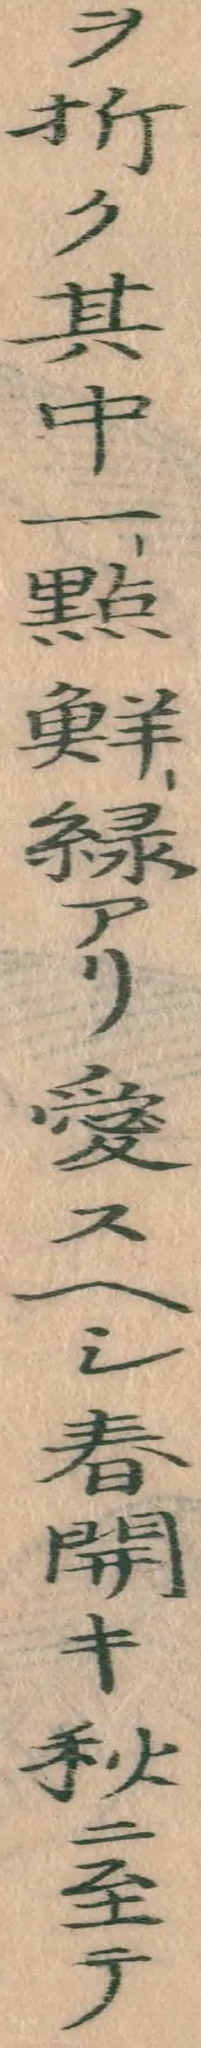ヲ折ク其中一-点鮮-緑アリ愛スヘシ春開キ秋ニ至テ
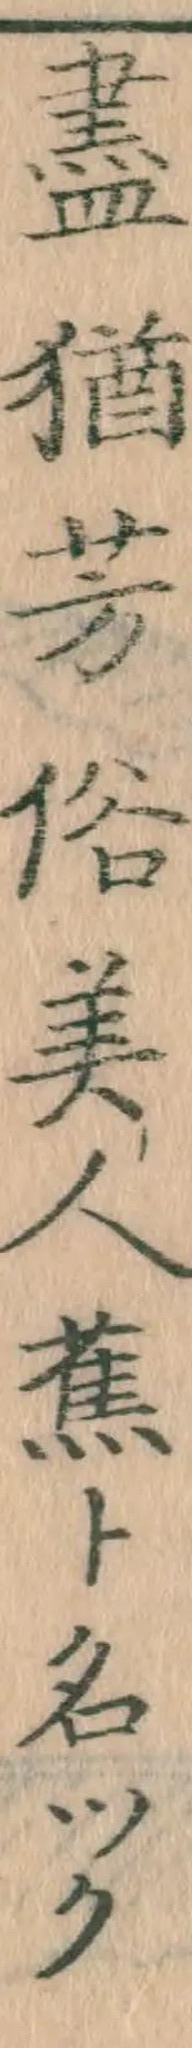尽猶芳俗美-人蕉ト名ツク

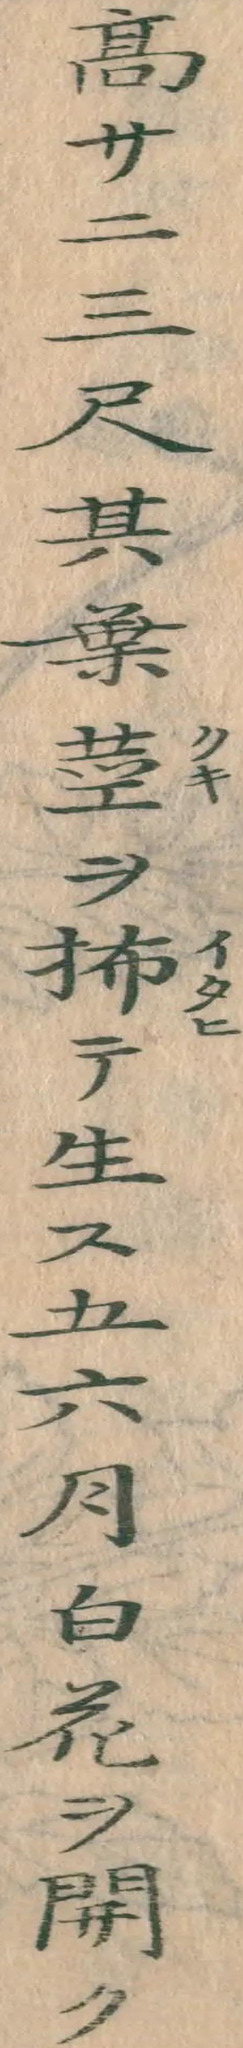高サ二三尺其葉茎ヲ抪テ生ス五六月白花ヲ開ク
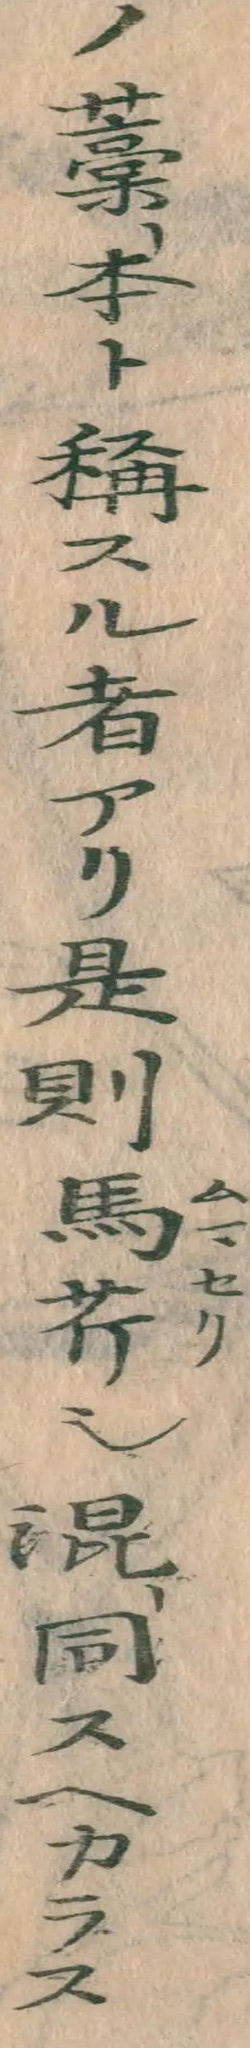ノ藁-本ト称スル者アリ是則馬芹也混-同スヘカラス

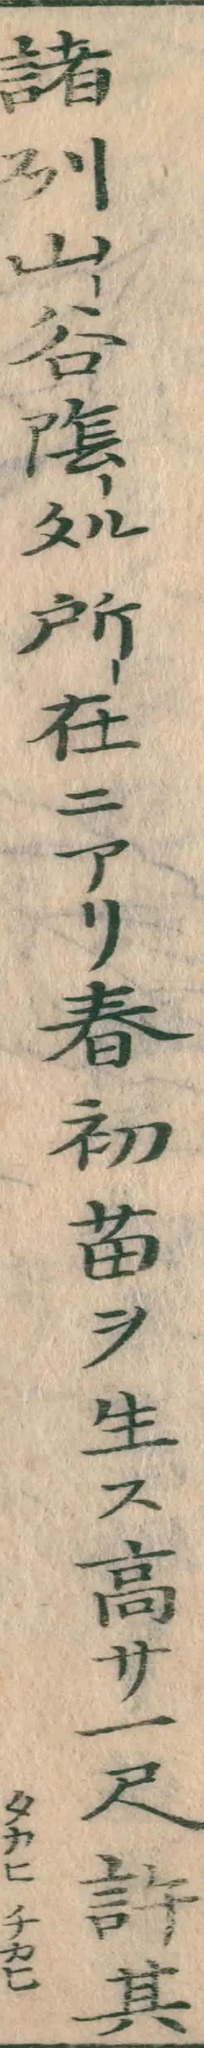諸州山-谷陰-処所-在ニアリ春初苗ヲ生ス高サ一尺許其
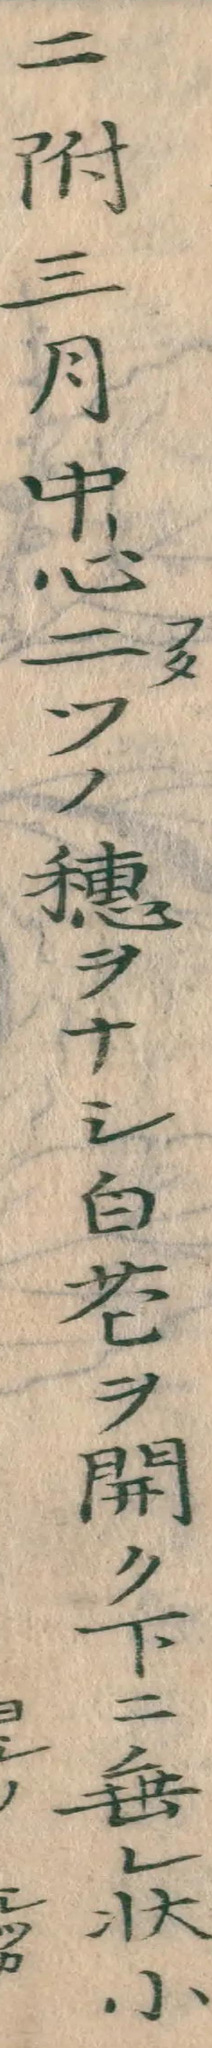ニ附三月中-心二ツノ穂ヲナシ白花ヲ開ク下ニ垂レ状小
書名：花彙 草部4巻木部4巻. [1]
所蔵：国立国会図書館 National Diet Library, JAPAN
